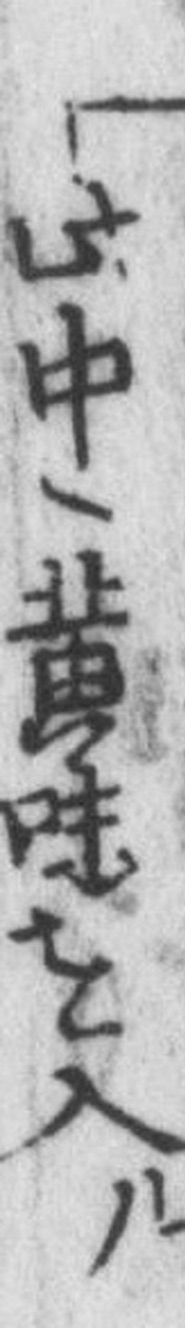此中へ白味を入る
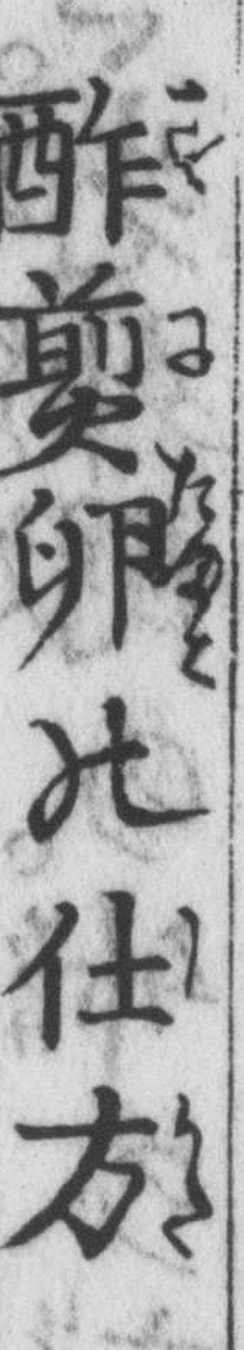酢煎卵の仕方
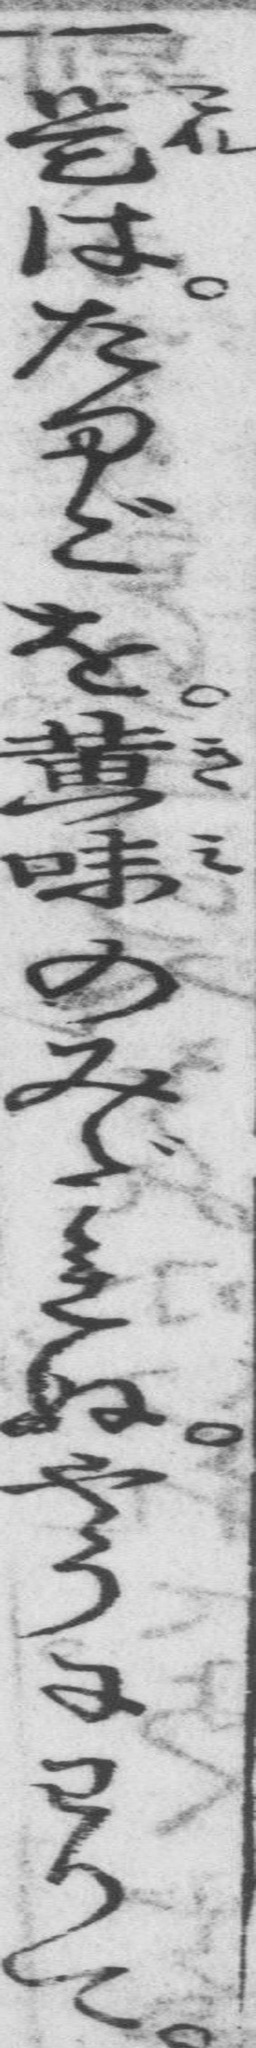一是は。たまごを。黄味のみだれぬやうにわりて。
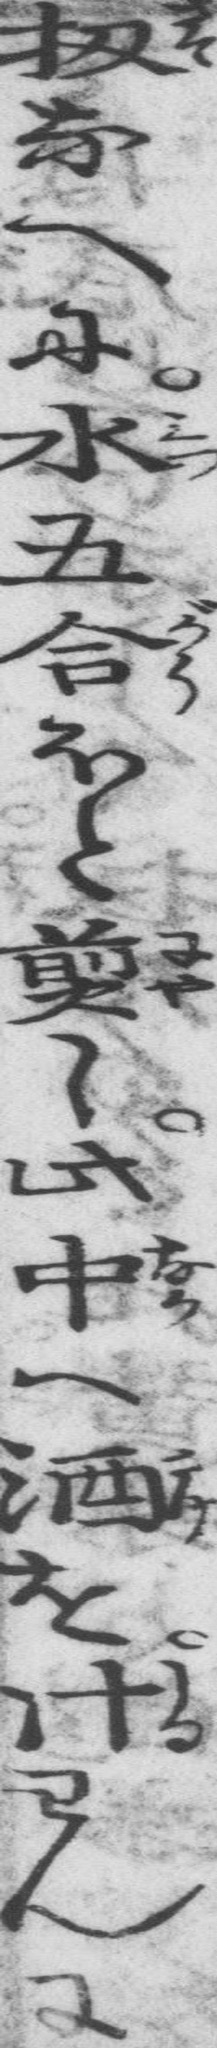扨なへに。水五合ほと煎し。此中へ酒を。汁わんに
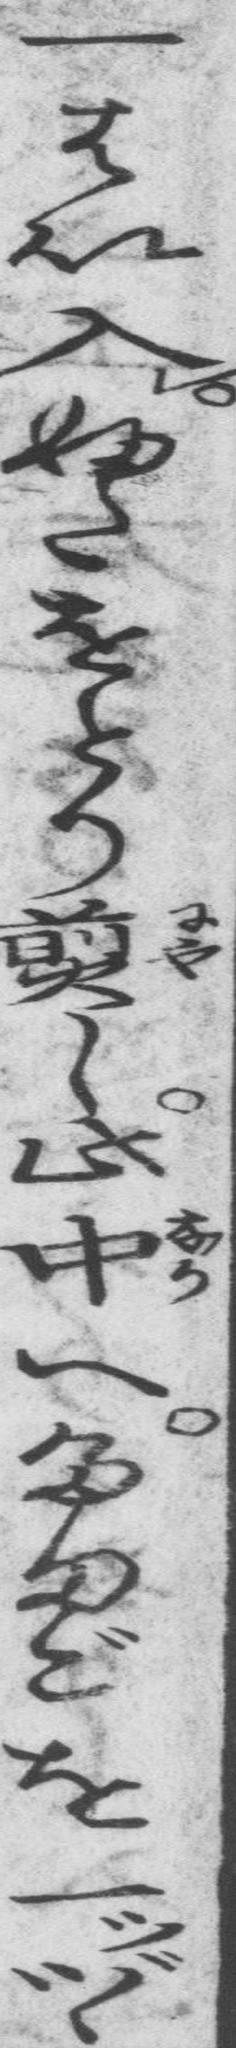一はい入れ。ふたをとり煎し。此中へ、たまごを一ツづゝ
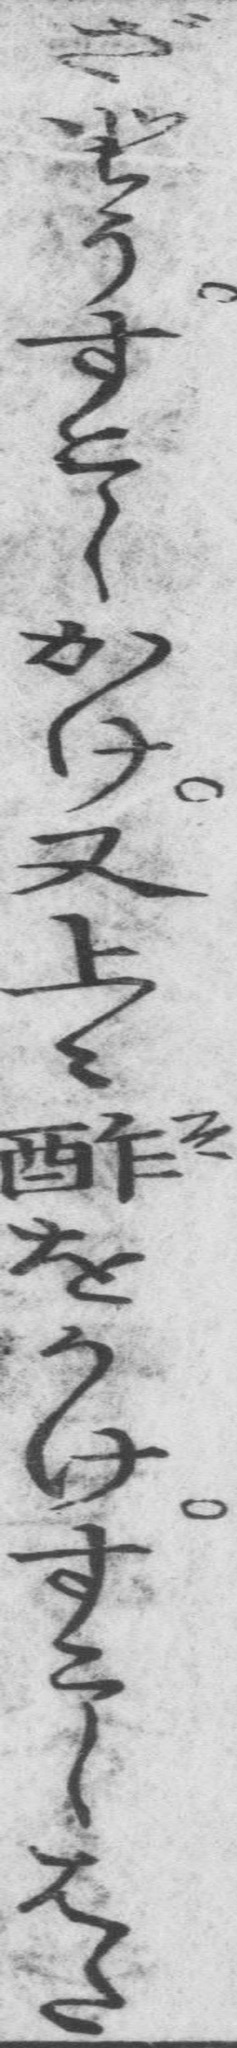ざとう。すこしかけ。又上々酢をかけ。すこしはた
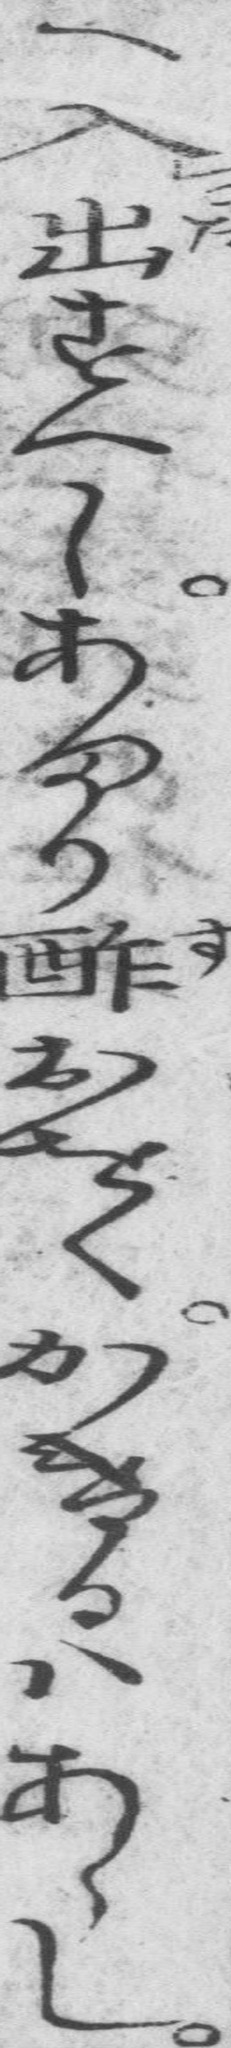へ入れ。出すへし。あまり酢おをく。かけるはあしし。
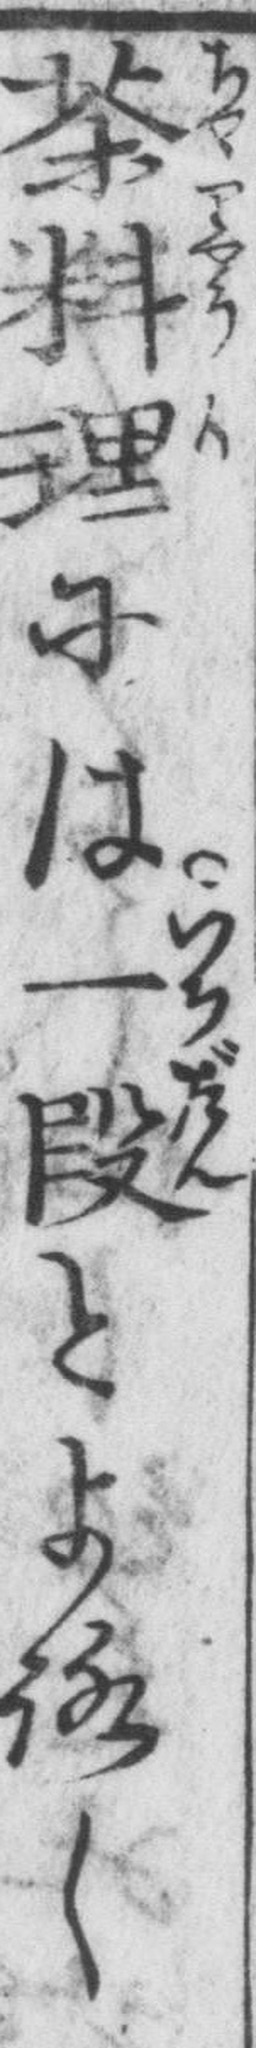茶料理には。一段とよろし
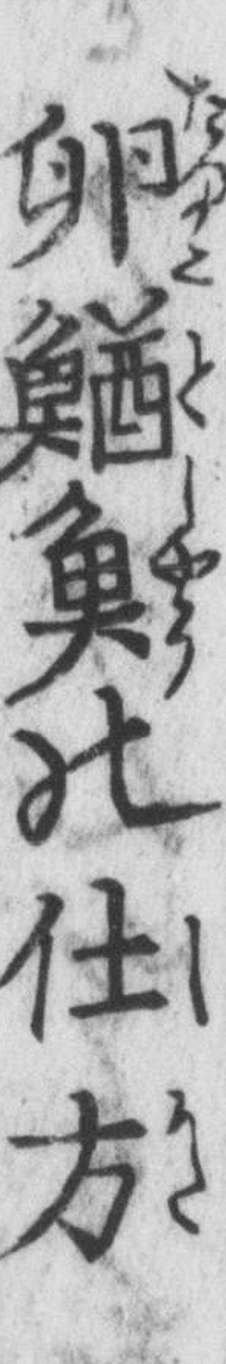卵鰌魚の仕方
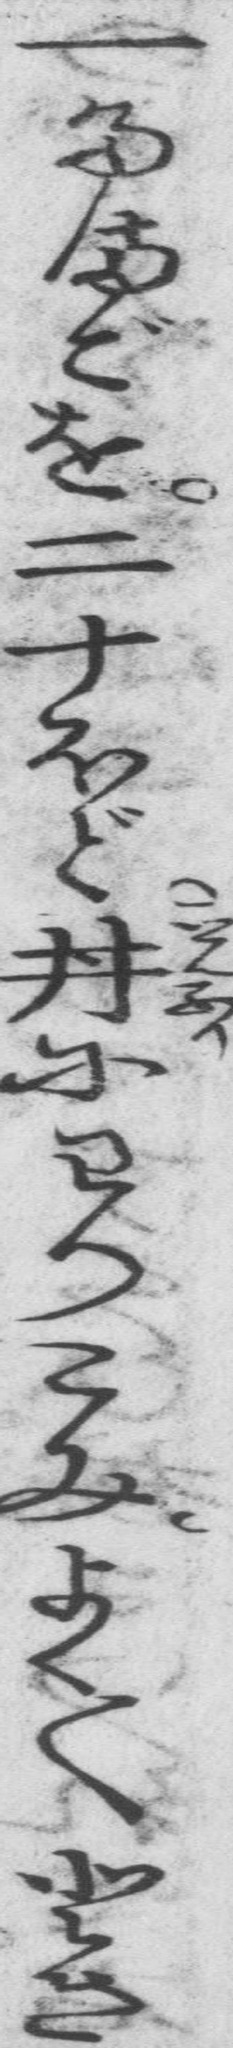一たまごを。二十ほど。丼にわりこみ。よく〳〵とき
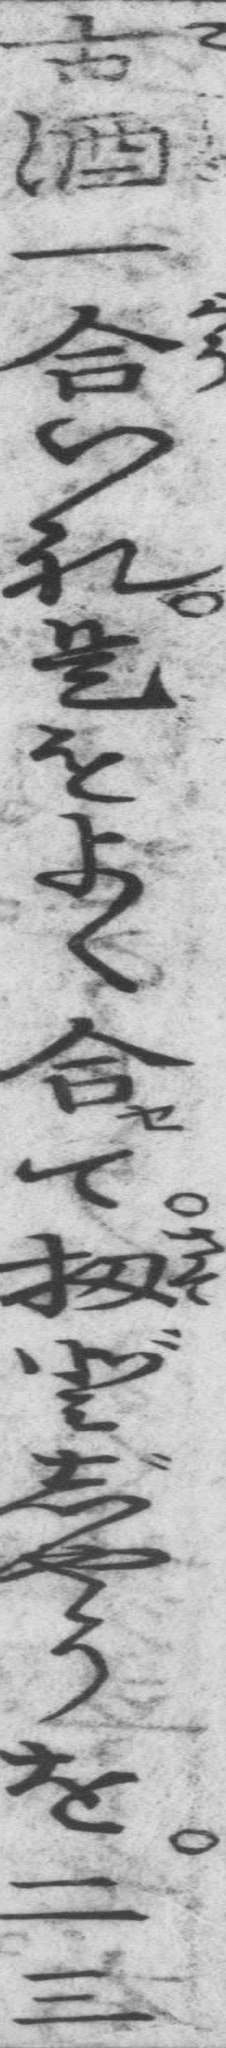古酒一合いれ。是もよく合せて。扨どじやうを。二三
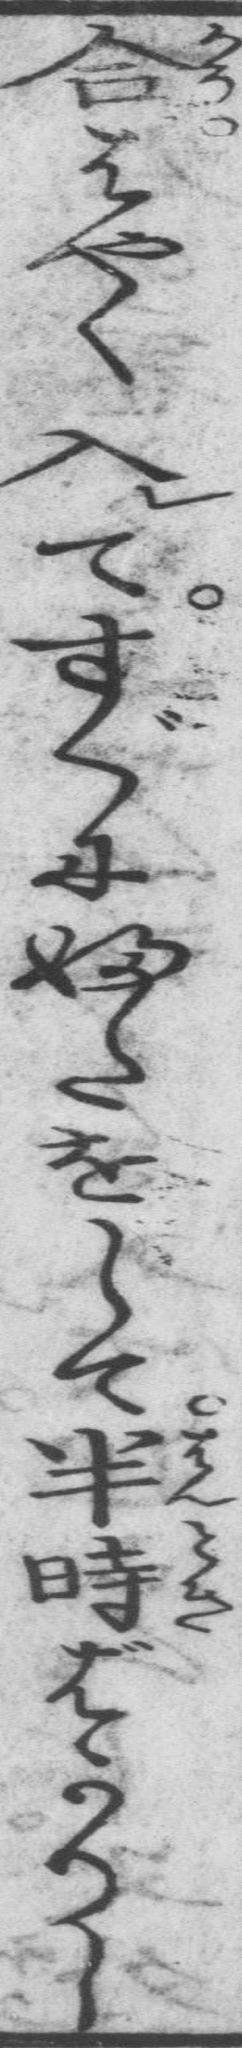合。はやく入れて。すぐにふたをして。半時ばかりし

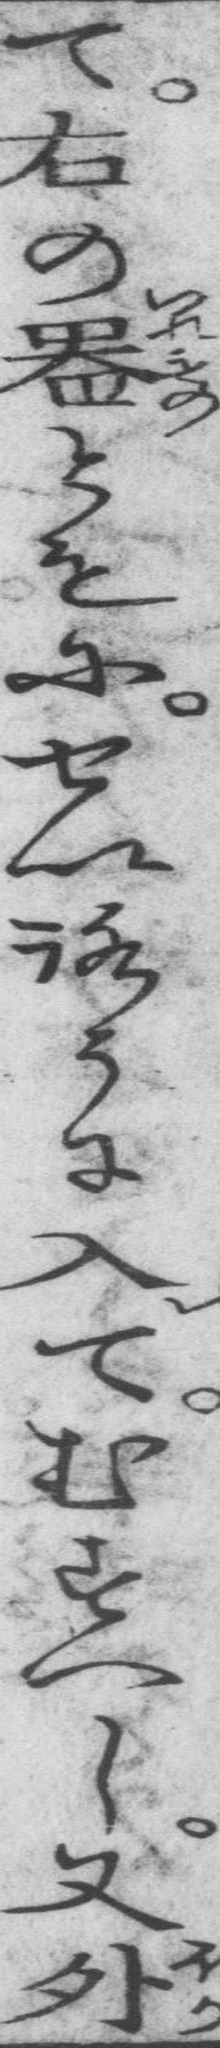て。右の器ともに。せいろうに入れて。むすへし。又外
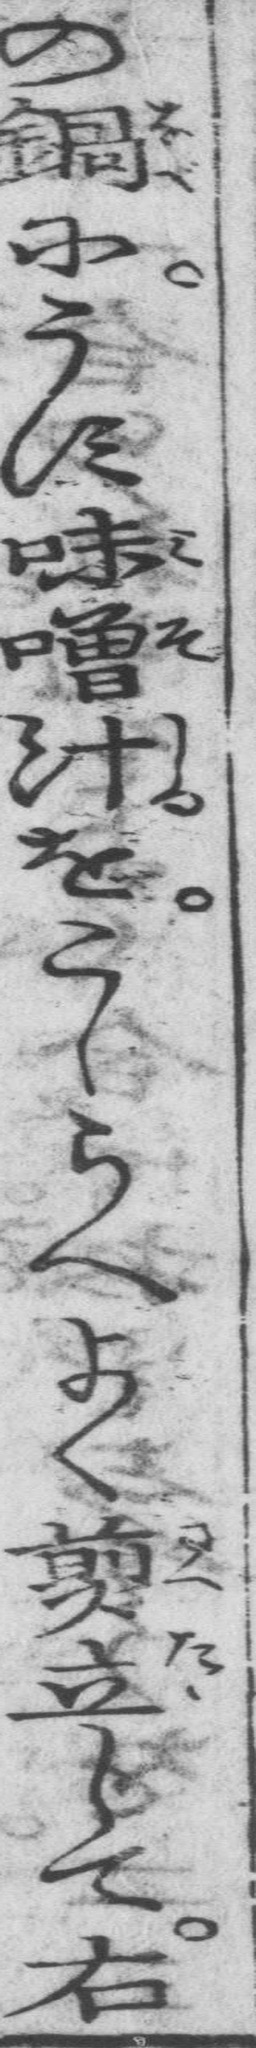の鍋に。うす味噌汁を。こしらへよく煎立して。右
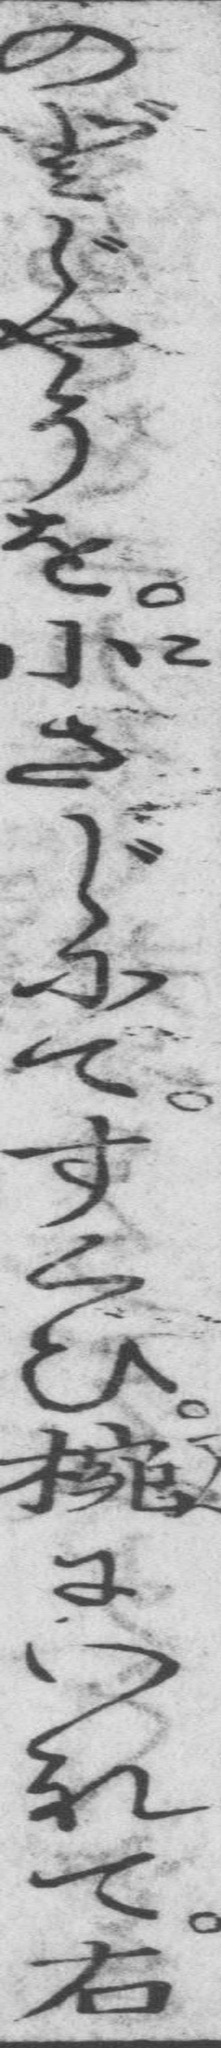のどじやうを。小さじにて。すくひ。椀にいれて。右
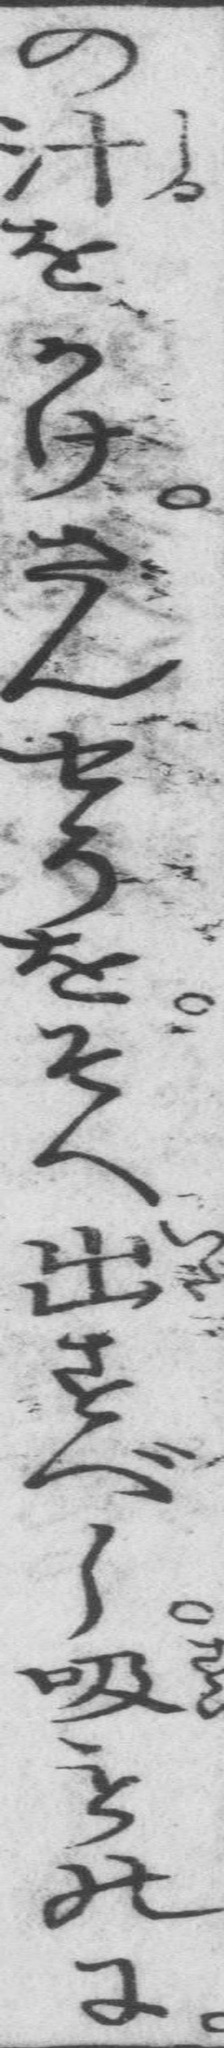の汁をかけ。さんせうを。そへ出すべし。吸ものに。
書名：萬寳料理秘密箱
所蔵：大阪府立大学学術情報センター 国文学研究資料館
